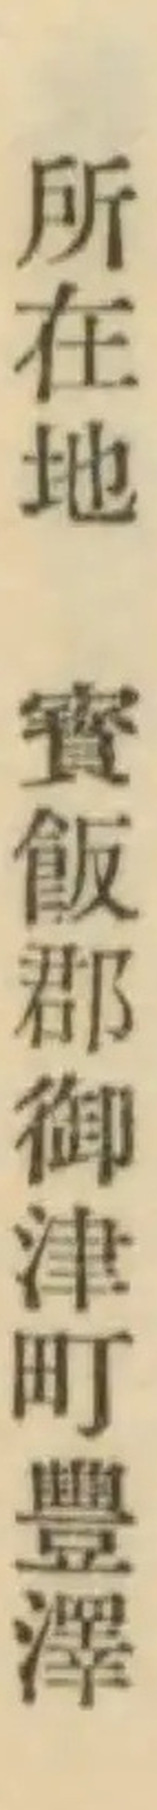所在地宝飯郡御津町豊沢
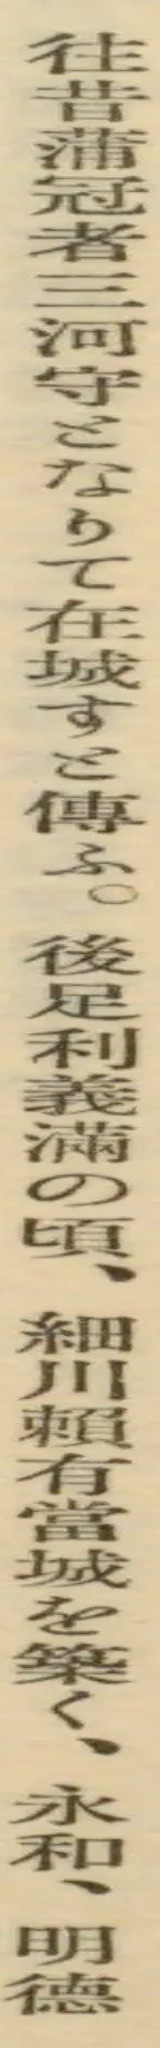往昔蒲冠者三河守となりて在城すと伝ふ。後足利義満の頃、細川頼有当城を築く、永和、明徳
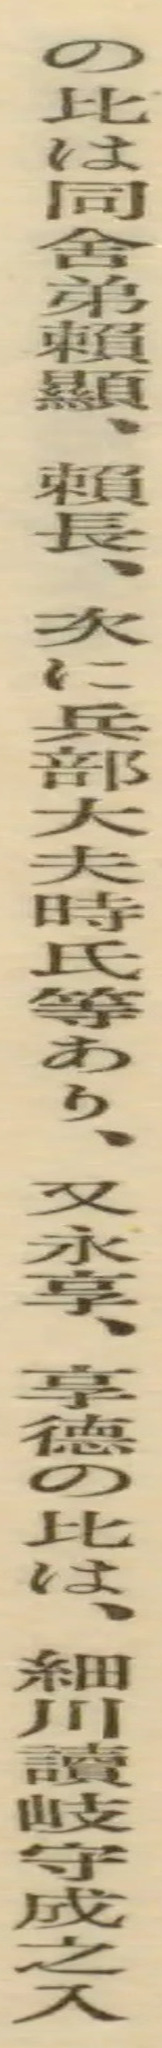の比は同舎弟頼顕、頼長、次に兵部大夫時氏等あり、又永享、享徳の比は、細川讃岐守成之入
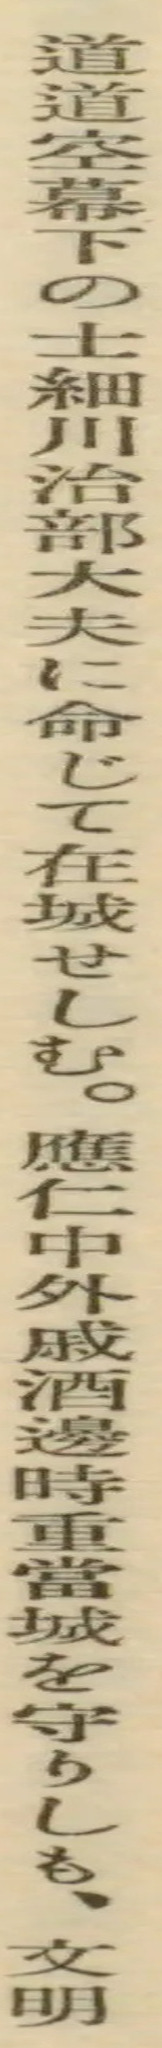道道空幕下の士細川治部大夫に命じて在城せしむ。応仁中外戚酒辺時重当城を守りしも、文明
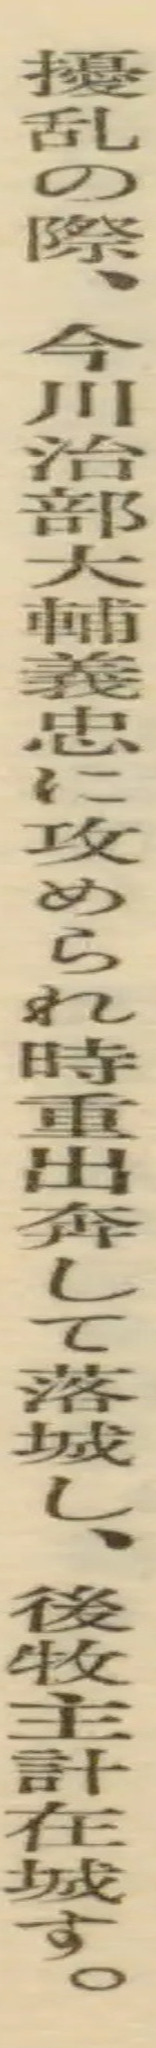擾乱の際、今川治部大輔義忠に攻められ時重出奔して落城し、後牧主計在城す。
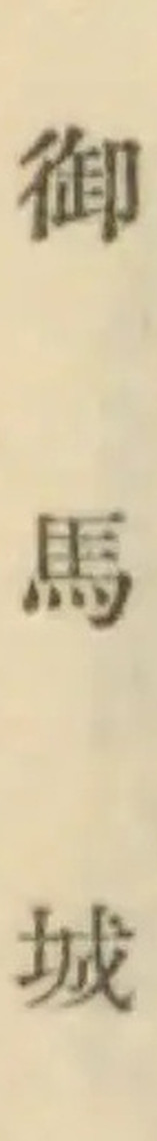御馬城
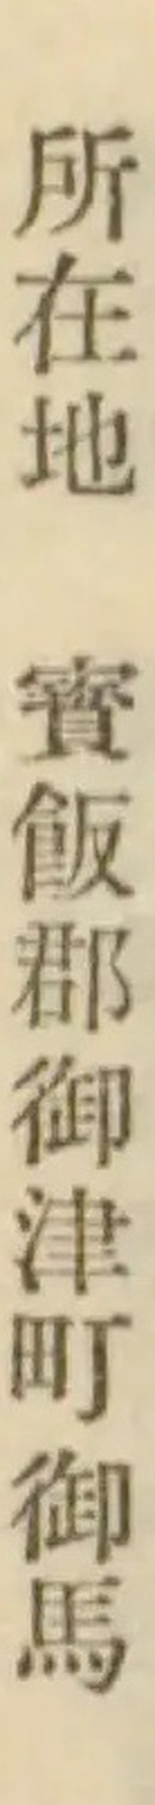所在地宝飯郡御津町御馬
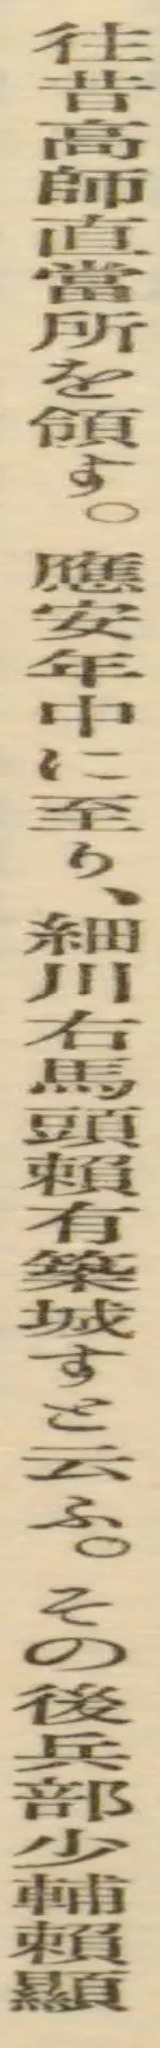往昔高師直当所を領す。応安年中に至り、細川右馬頭頼有築城すと云ふ。その後兵部少輔頼顕
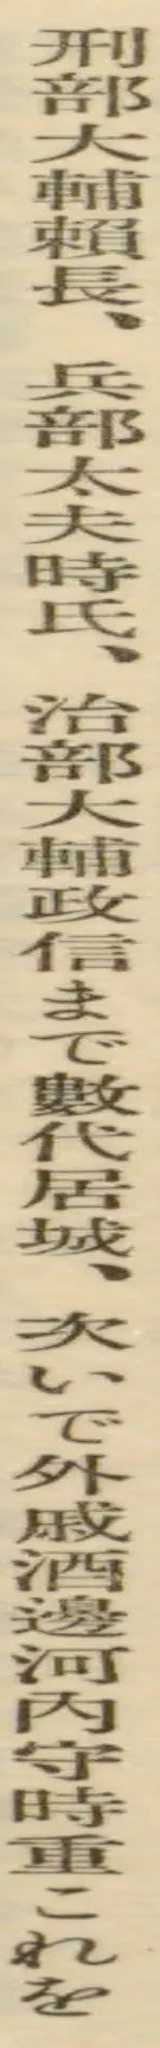刑部大輔頼長、兵部太夫時氏、治部大輔政信まで数代居城、次いで外戚酒辺河内守時重これを
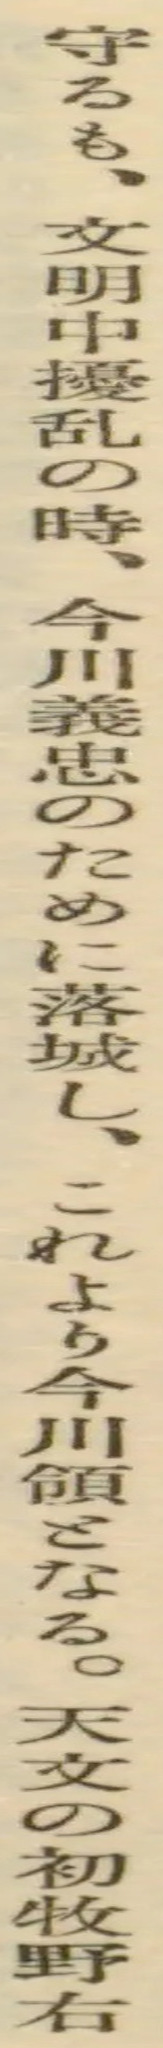守るも、文明中擾乱の時、今川義忠のために落城し、これより今川領となる。天文の初牧野右
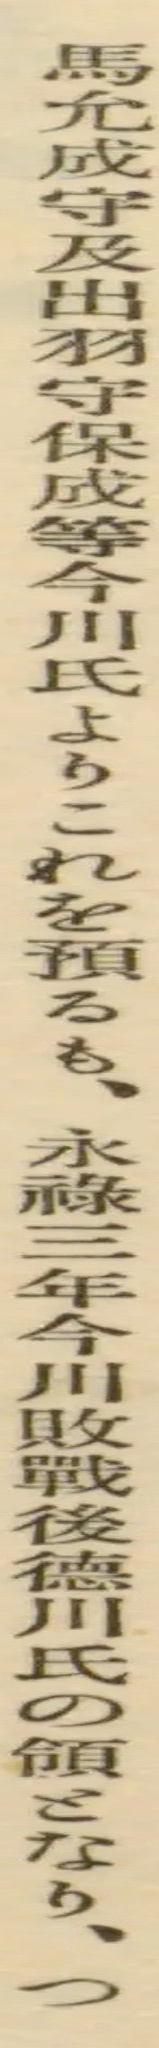馬允成守及出羽守保成等今川氏よりこれを預るも、永禄三年今川敗戦後徳川氏の領となり、つ
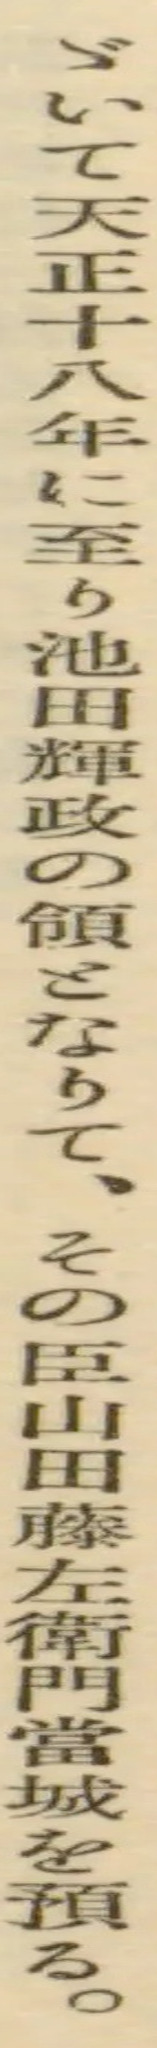ゞいて天正十八年に至り池田輝政の領となりて、その臣山田藤左衛門当城を預る。
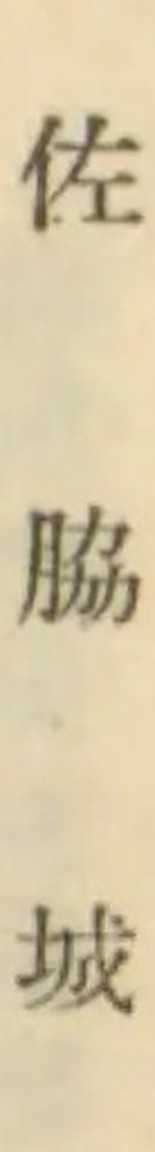佐脇城
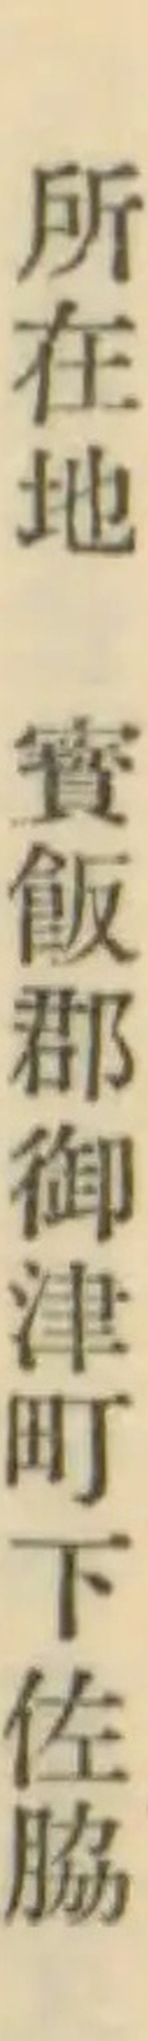所在地宝飯郡御津町下佐脇

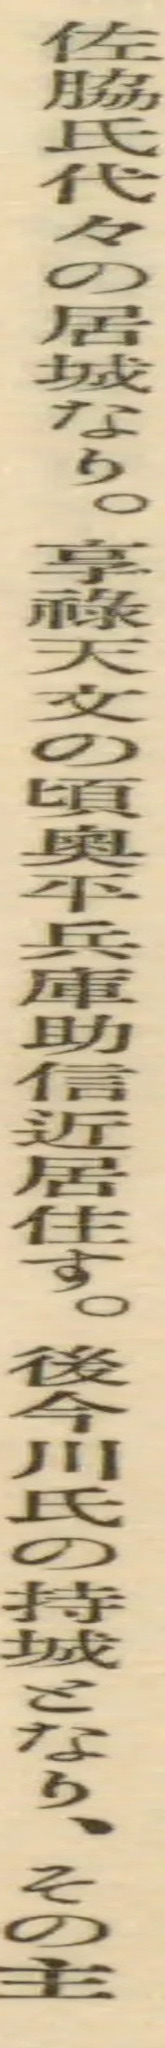佐脇氏代々の居城なり。享禄天文の頃奥平兵庫助信近居住す。後今川氏の持城となり、その主
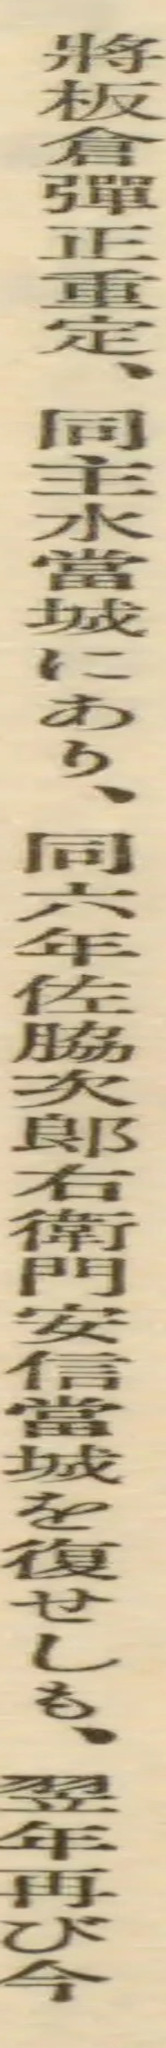将板倉弾正重定、同主水当城にあり、同六年佐脇次郎右衛門安信当城を復せしも、翌年再び今
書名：東三河之古城
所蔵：国立国会図書館 National Diet Library, JAPAN
